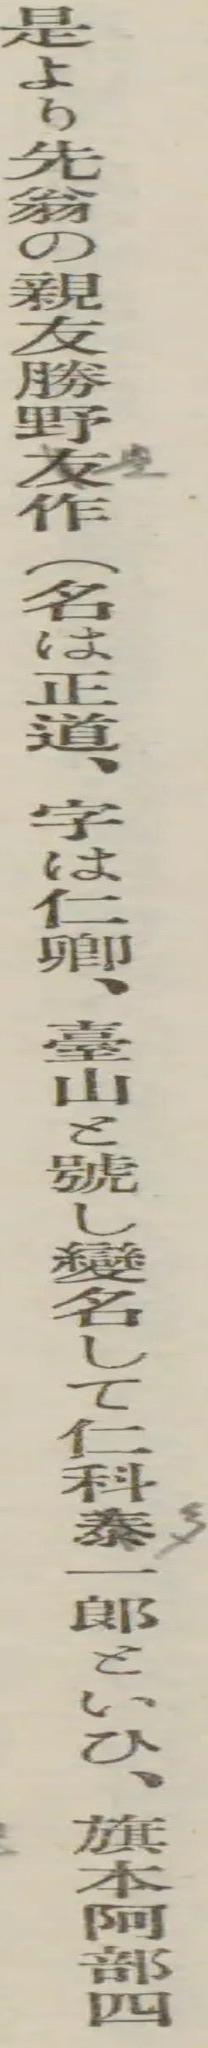是より先翁の親友勝野友作(名は正道、字は仁卿、臺山と号し変名して仁科泰一郎といひ、旗本阿部四
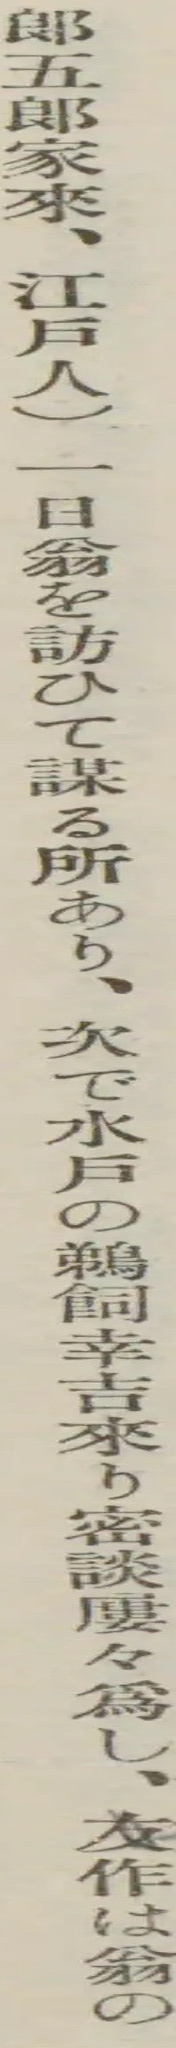郎五郎家来、江戸人)一日翁を訪ひて謀る所あり、次で水戸の鵜飼幸吉来り密談屡々為し、友作は翁の
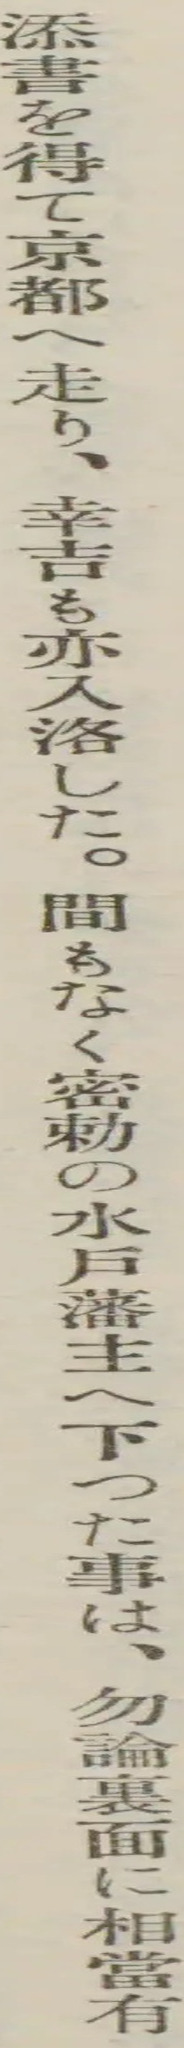添書を得て京都へ走り、幸吉も亦入洛した。間もなく密勅の水戸藩主へ下つた事は、勿論裏面に相当有
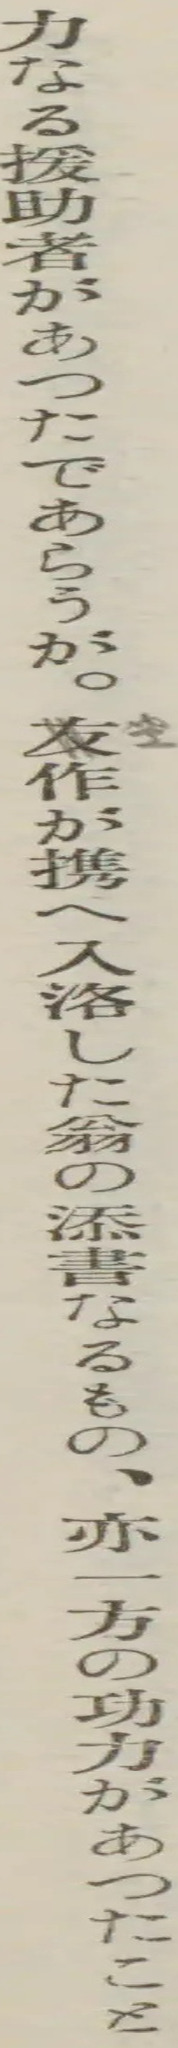力なる援助者があつたであらうが。友作が携へ入洛した翁の添書なるもの、亦一方の功力があつたこと
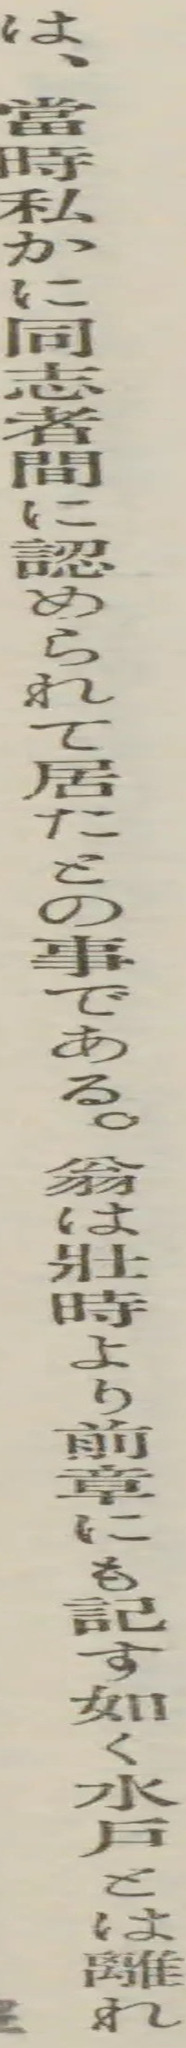は、当時私に同志者間に認められて居たとの事である。翁は壮時より前章にも記す如く水戸とは離れ
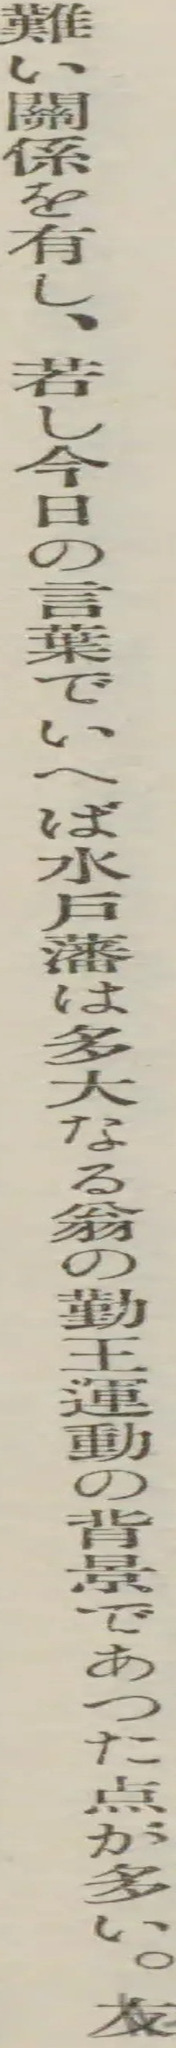難い関係を有し、若し今日の言葉でいへば水戸藩は多大なる翁の勤王運動の背景であつた点が多い。友
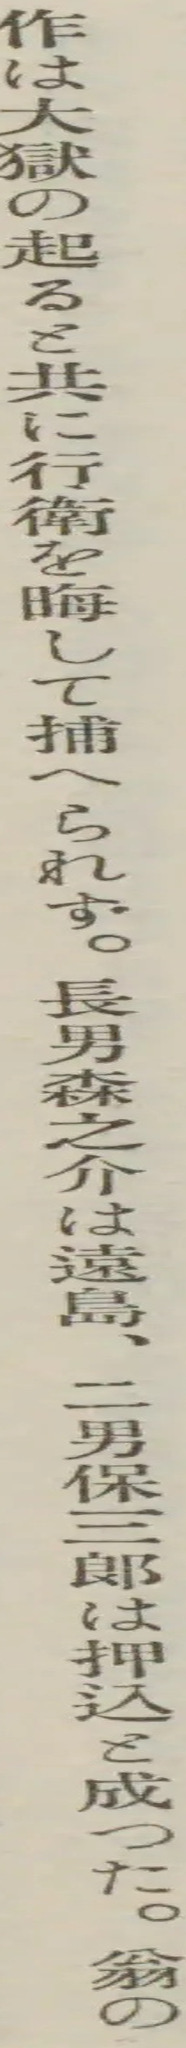作は大獄の起ると共に行衛を晦して捕へられず。長男森之介は遠島、二男保三郎は押込と成つた。翁の
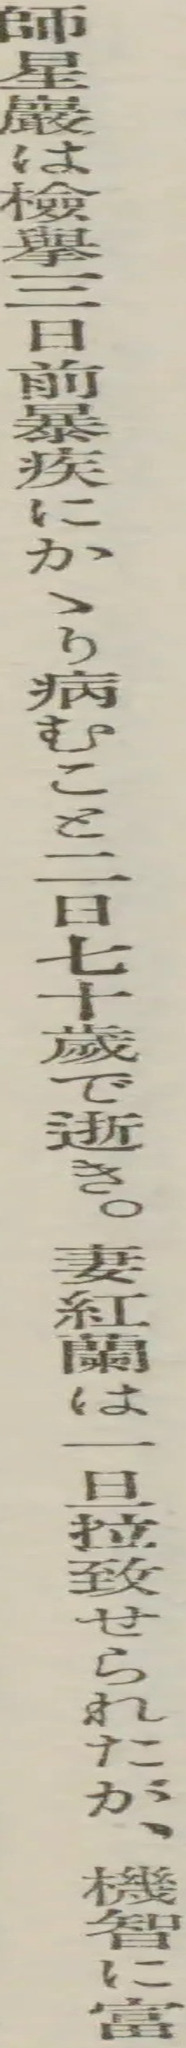師星巖は検挙三日前暴疾にかゝり病むこと二日七十歳で逝き。妻紅蘭は一旦拉致せられたが、機智に富
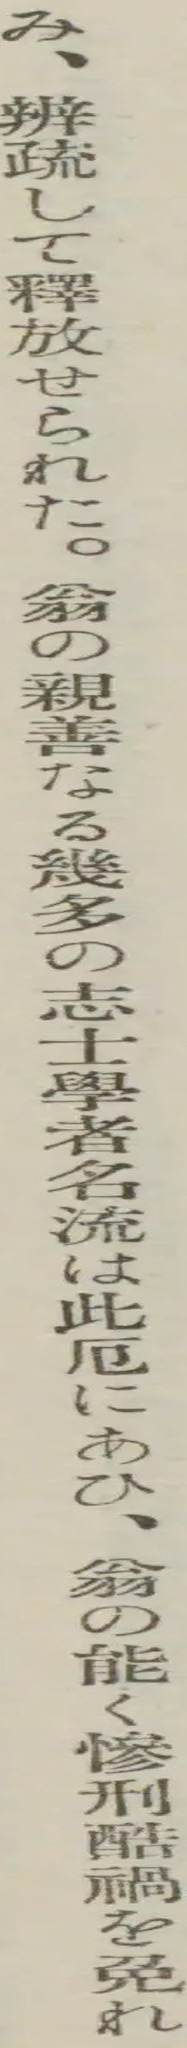み、弁疏して釈放せられた。翁の親善なる幾多の志士学者名流は此厄にあひ、翁の能く惨刑酷禍を免れ
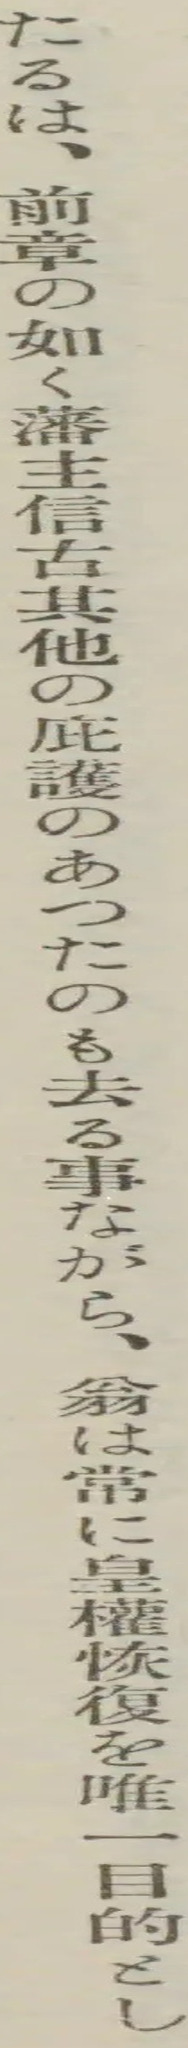たるは、前章の如く藩主信古其他の庇護のあつたのも去る事ながら、翁は常に皇権恢復を唯一目的とし
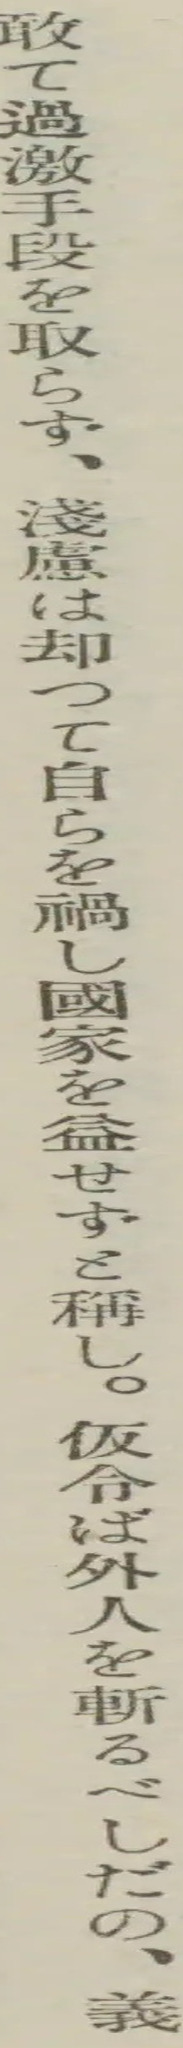敢て過激手段を取らず、浅慮は却つて自らを禍し国家を益せずと称し。仮令ば外人を斬るべしだの、義
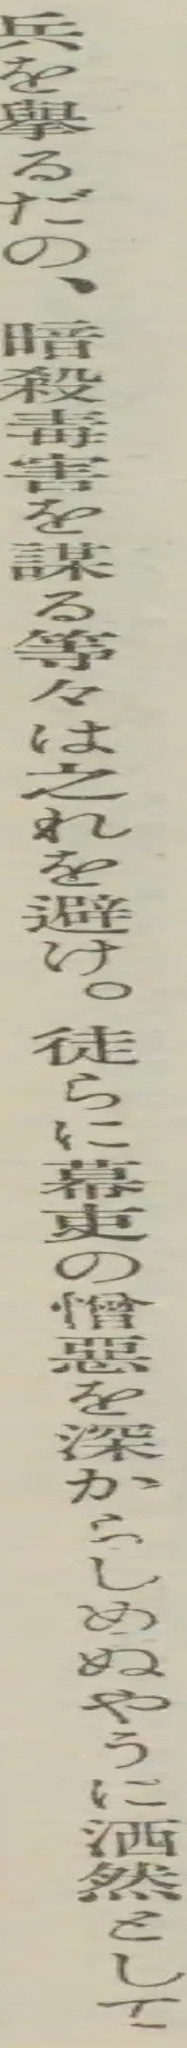兵を挙るだの、暗殺毒害を謀る等々は之れを避け。徒らに幕吏の憎悪を深からしめぬやうに洒然として
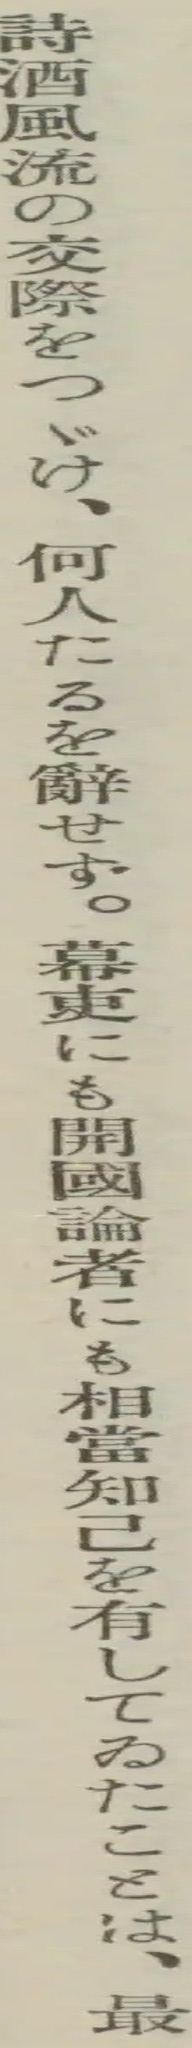詩酒風流の交際をつゞけ、何人たるを辞せず。幕吏にも開国論者にも相当知己を有してゐたことは、最
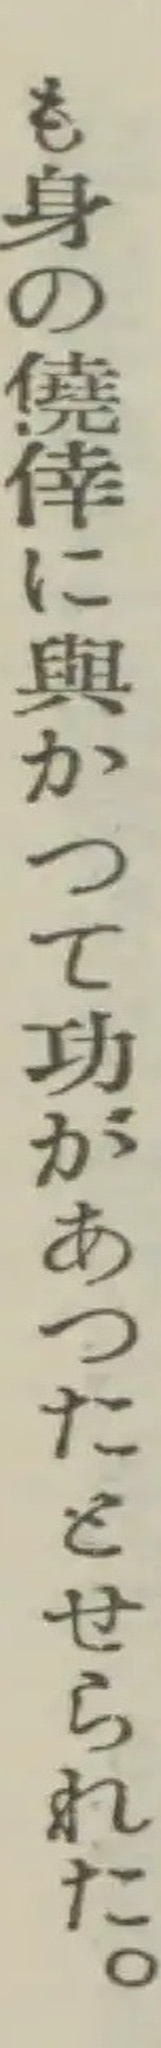も身の僥倖に与かつて功があつたとせられた。
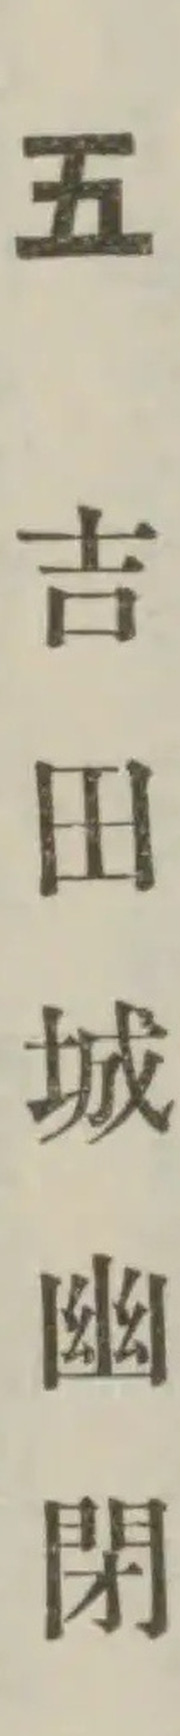五吉田城幽閉
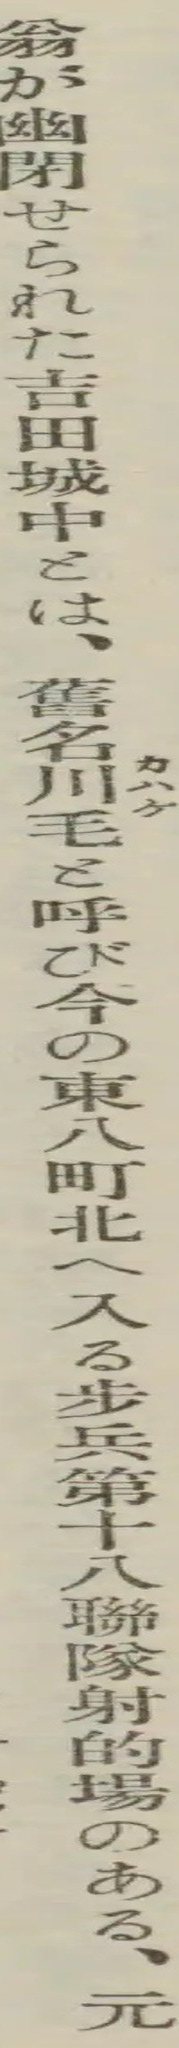翁が幽閉せられた吉田城中とは、旧名川毛と呼び今の東八町北へ入る歩兵第十八聯隊射的場のある、元
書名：小野湖山翁小伝
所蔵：国立国会図書館 National Diet Library, JAPAN
